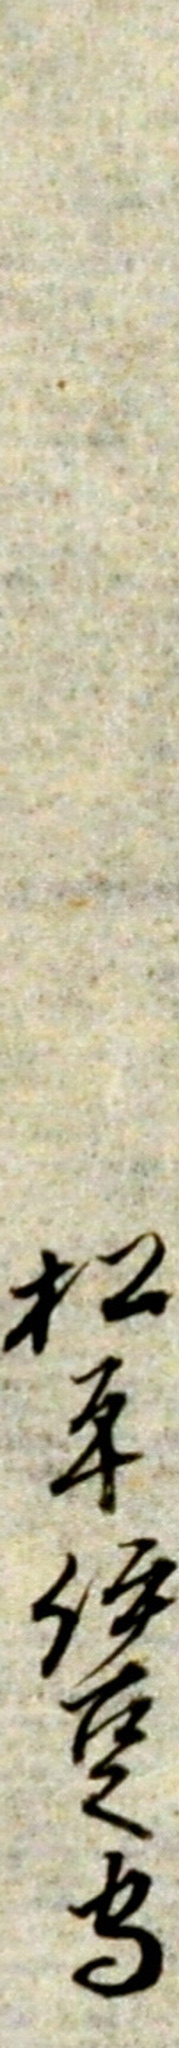松平伊豆守
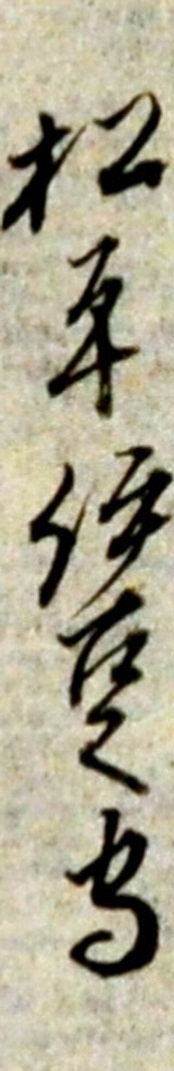松平伊豆守
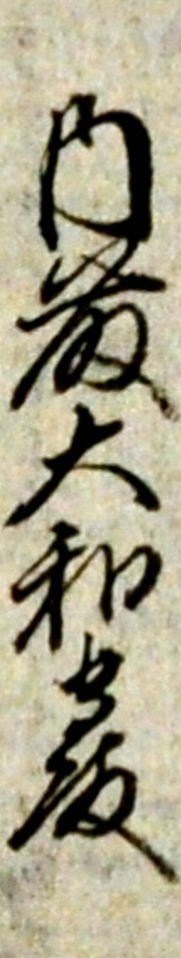内藤大和守殿
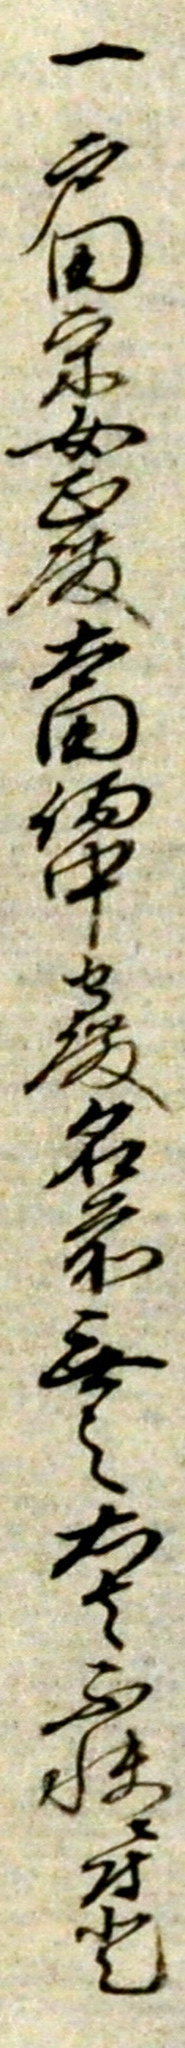一戸田采女正殿太田備中守殿名前無之右者不快二付登
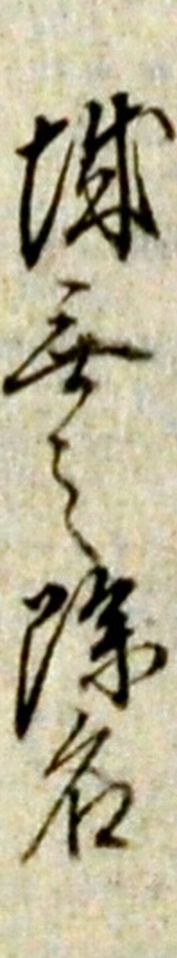城無之除名

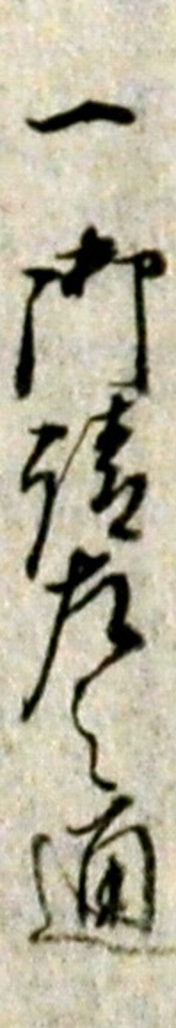一御請左之通
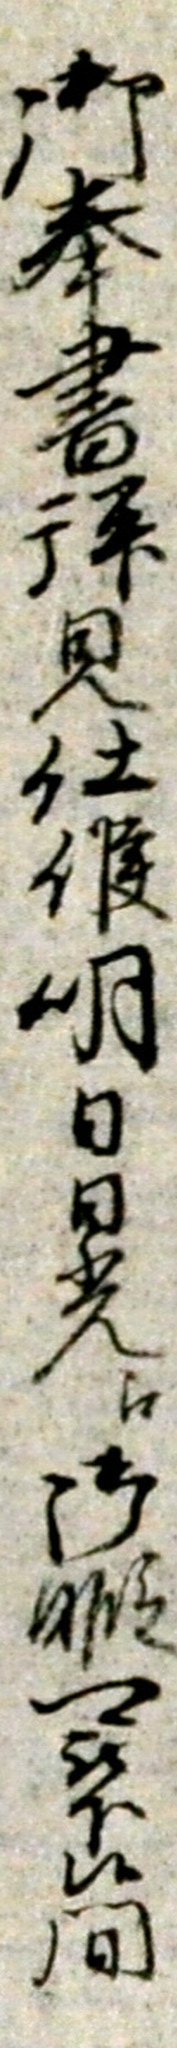御奉書拝見仕候明日日光御暇可被下候間
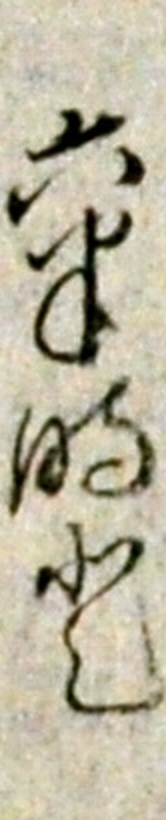六半時登
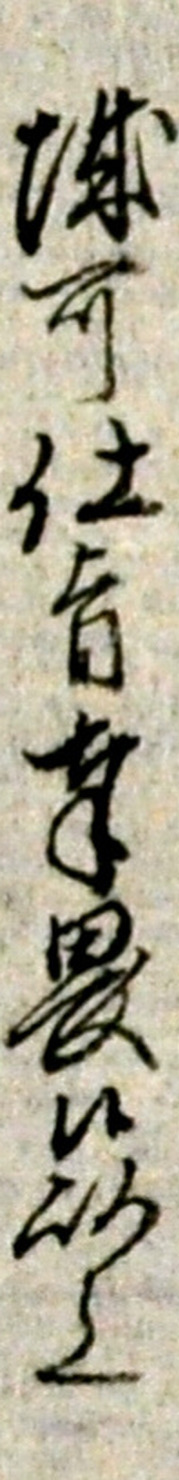城可仕旨奉畏候以上
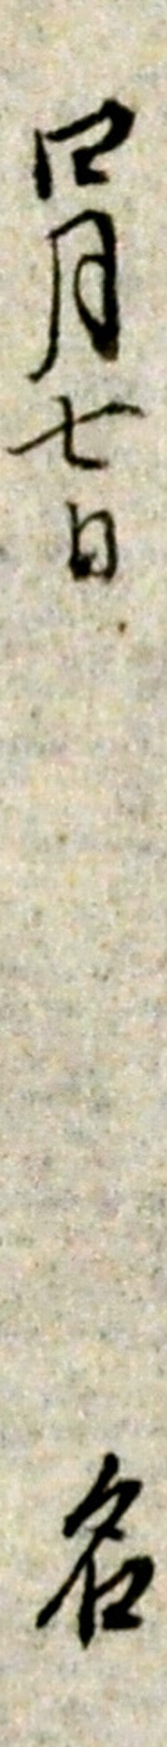四月七日名
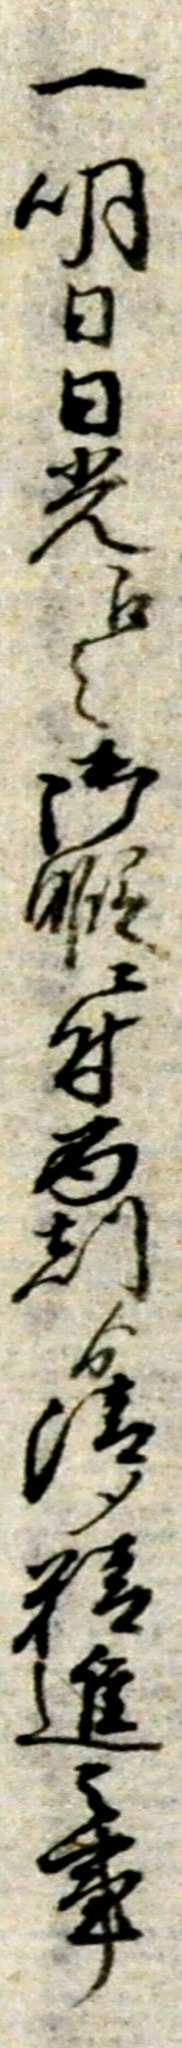一明日日光江之御暇二付酉刻ゟ清メ精進之事
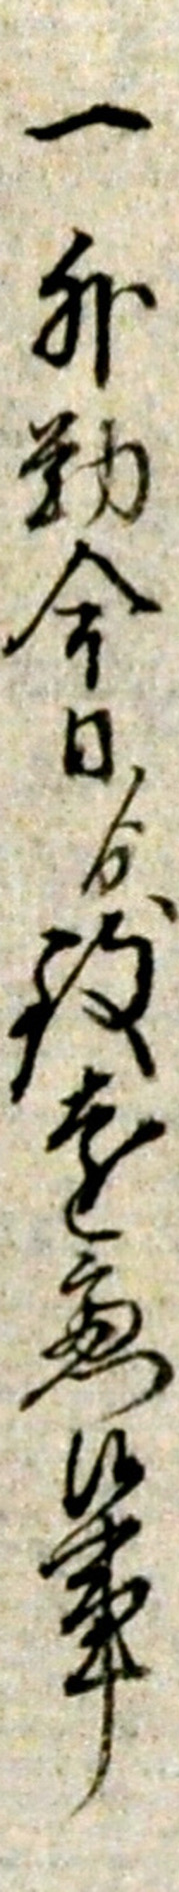一外勤今日ゟ致遠慮候事
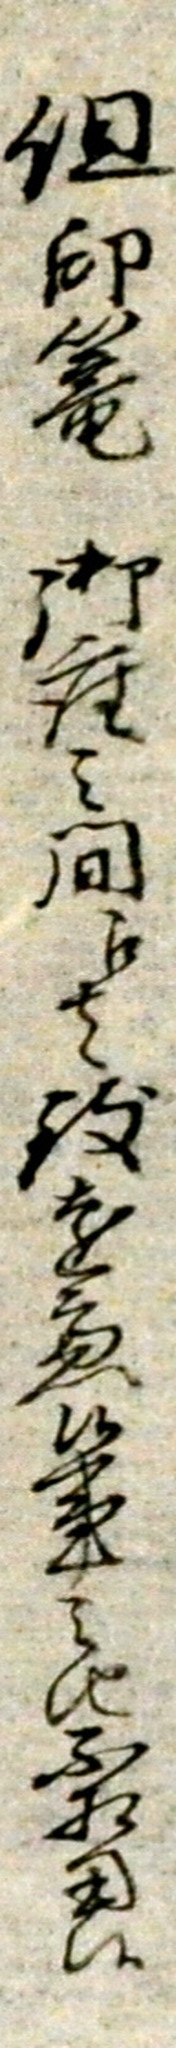但印籠御座之間江は致遠慮候事之由不相用候
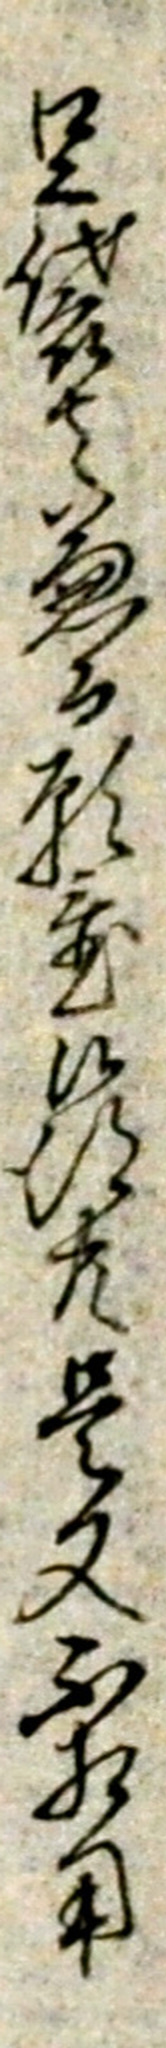足袋は兼而願置候得共不相用
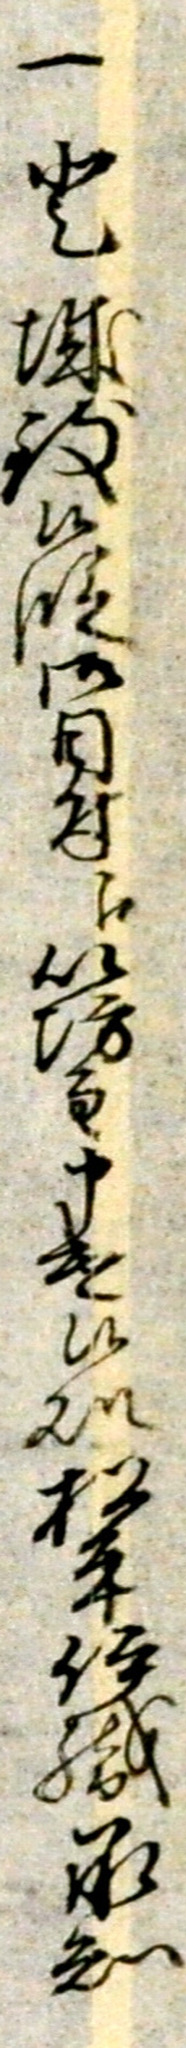一登城致候段御目付江以坊主申遣候処松平伊織承知
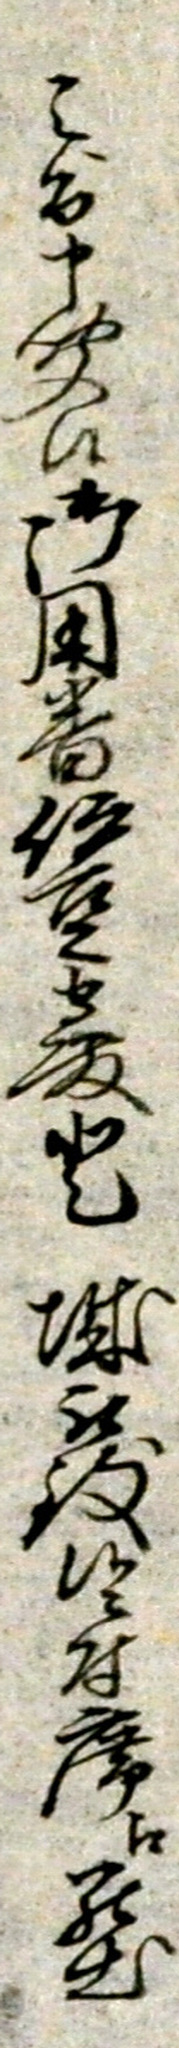之旨申聞候御用番伊豆守殿登城被致候二付席江罷出
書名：日光御名代相勤候節ノ留
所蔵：伊那市立高遠町図書館・合同会社AMANE
